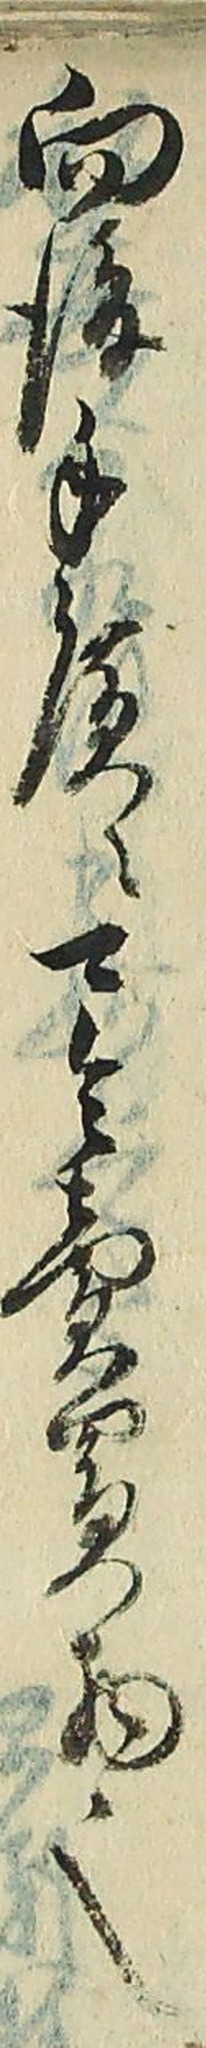向後手広に可令売買物也
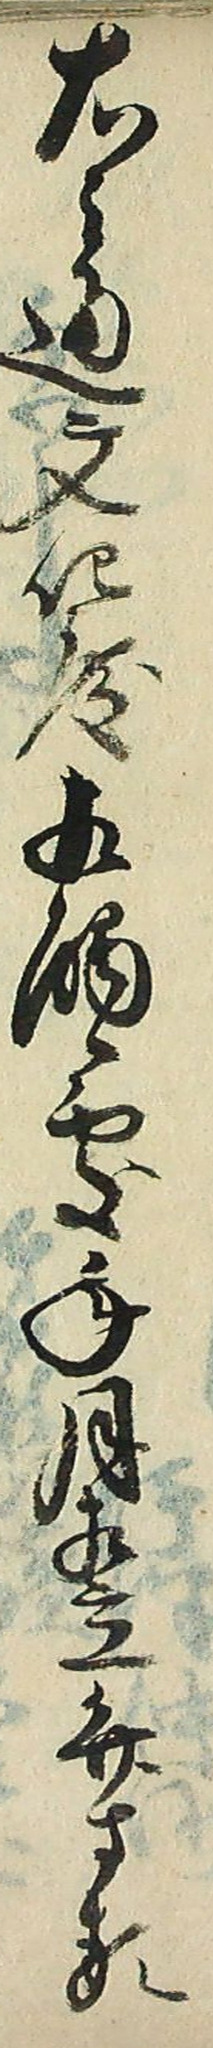右之通文化度相触候處年月相立弁さる
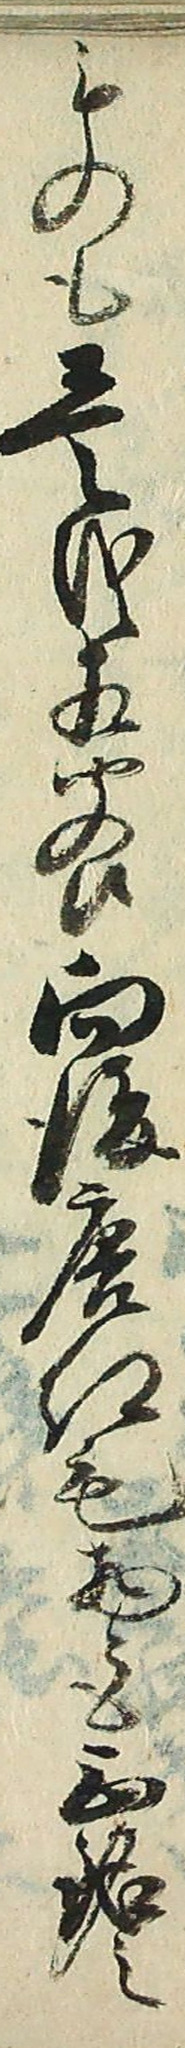ものも有之哉相聞候向後唐紅毛物とも正銘之
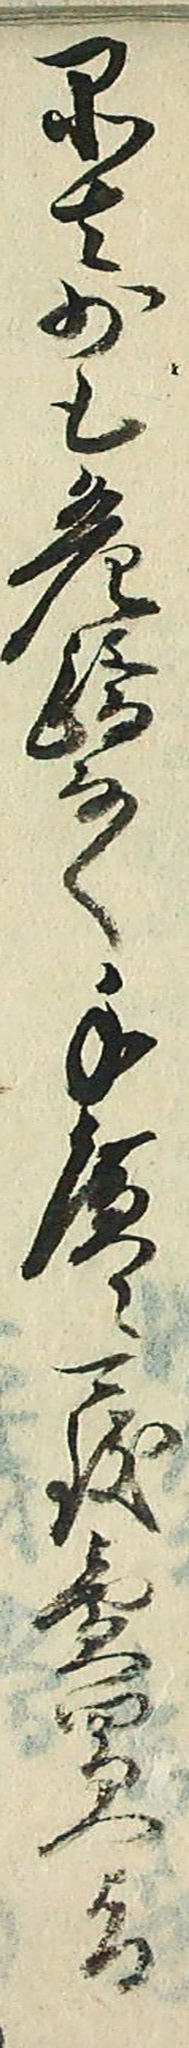品者少も危踏なく手広に可致売買旨
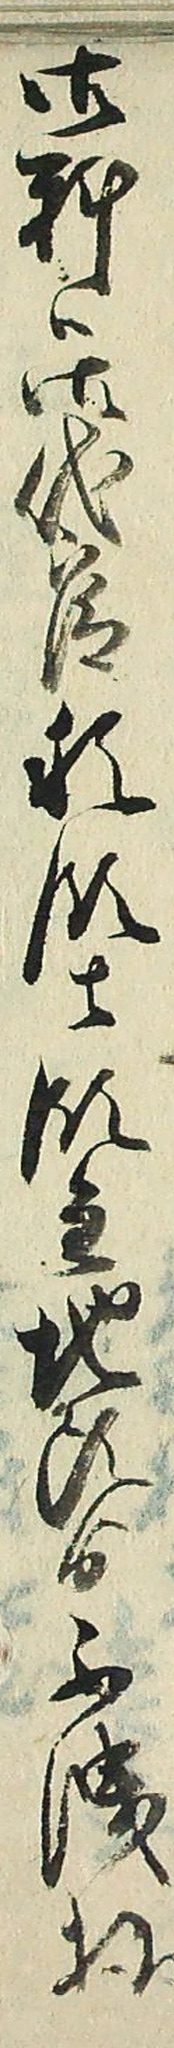御料は御代官私領者領主地頭ゟ不洩様
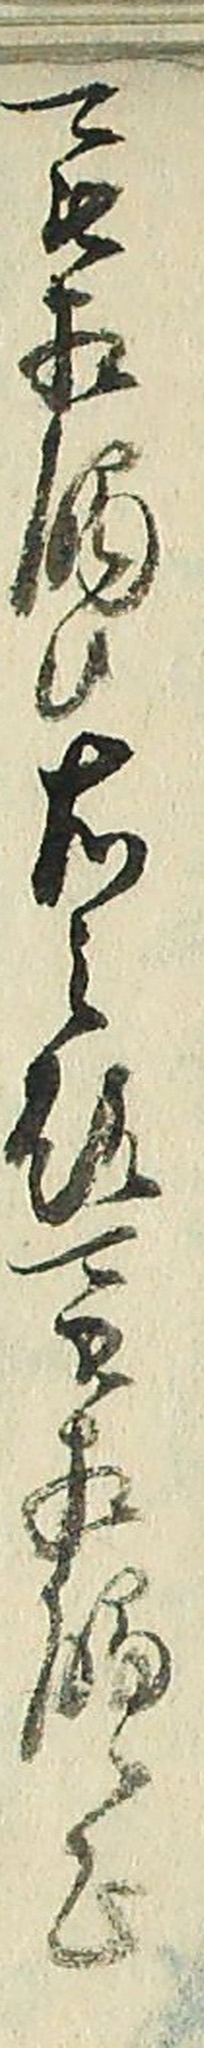可被相触候右之趣可被相触候以上
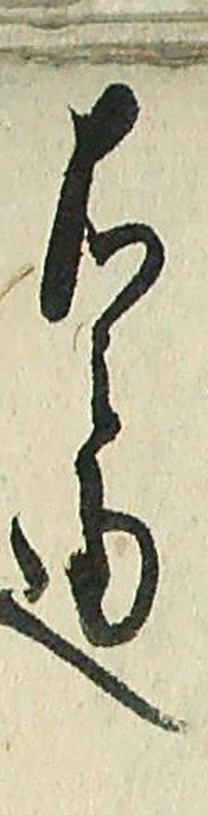右之通
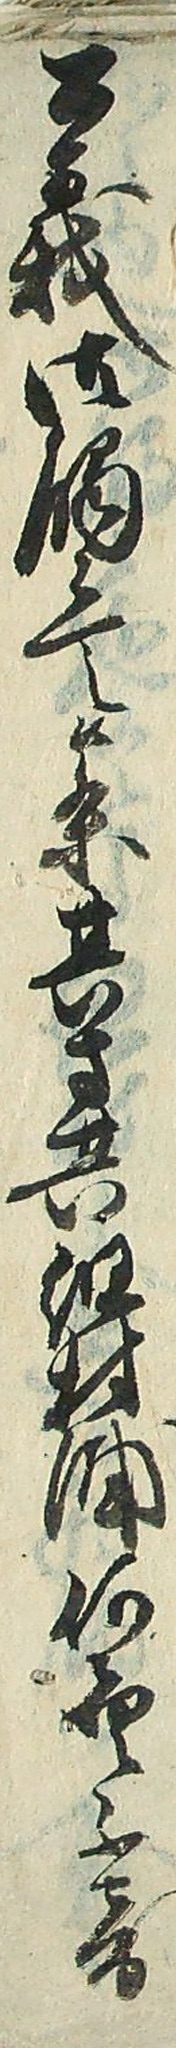公義御触有之候条其方共組村浦何宿に不寄

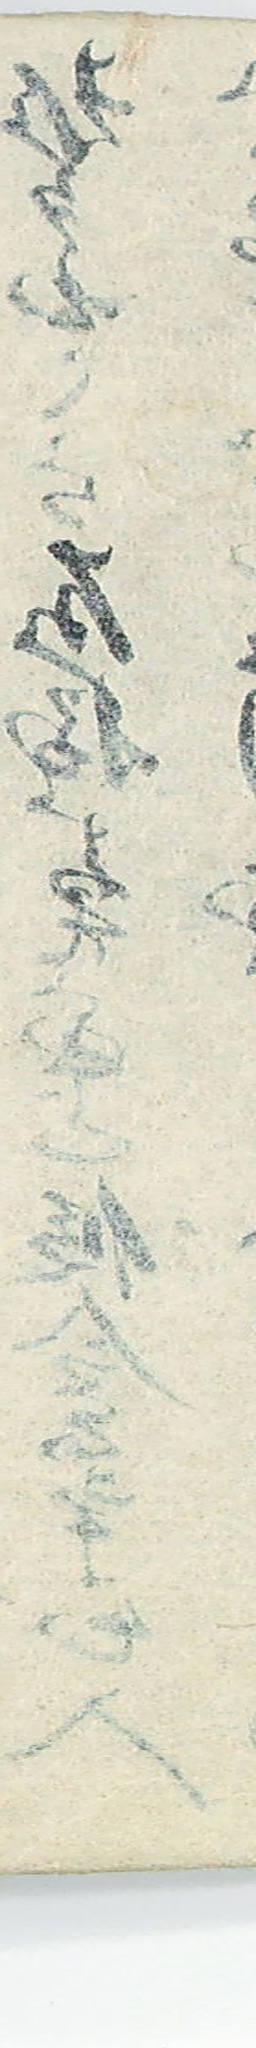四月廿六日
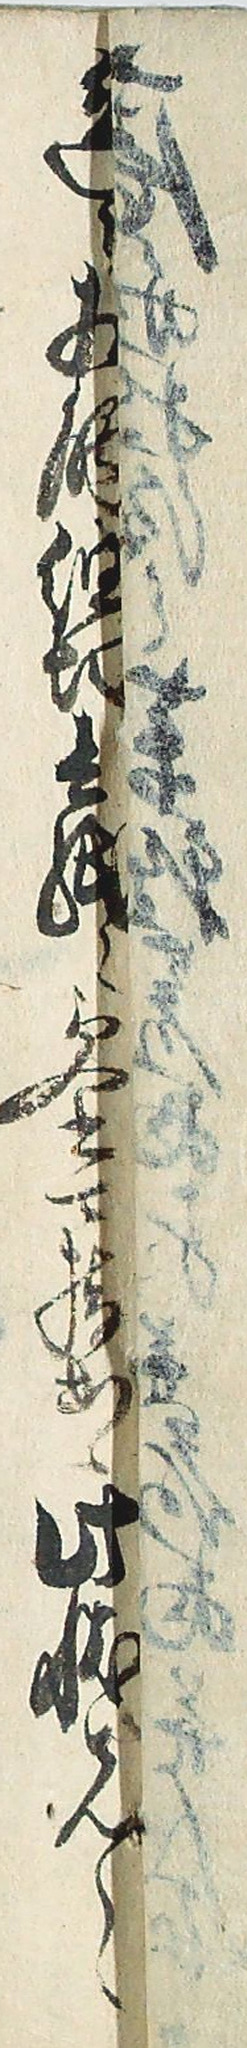逸々相触組切壱紙受書可指出候此状先々
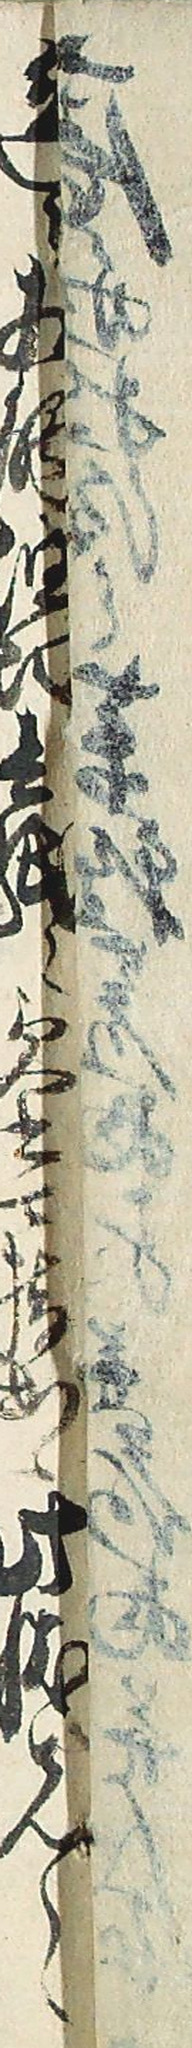逸々相触組切壱紙受書可指出候此状先々
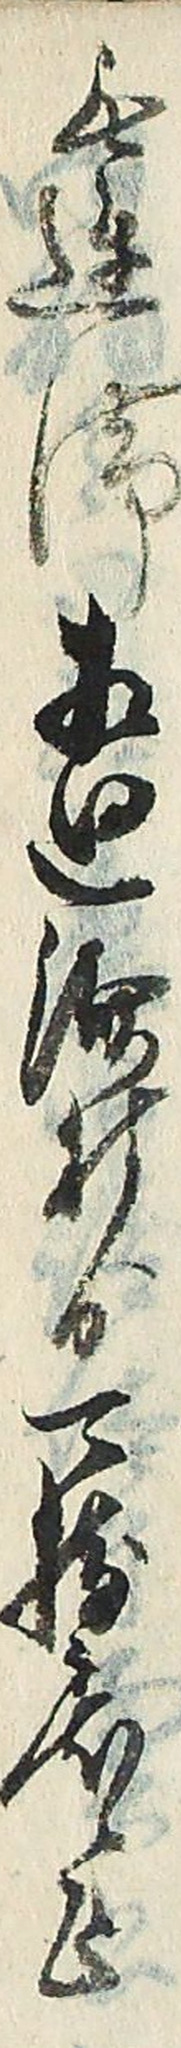無遅滞相廻済村ゟ可指戻候以上
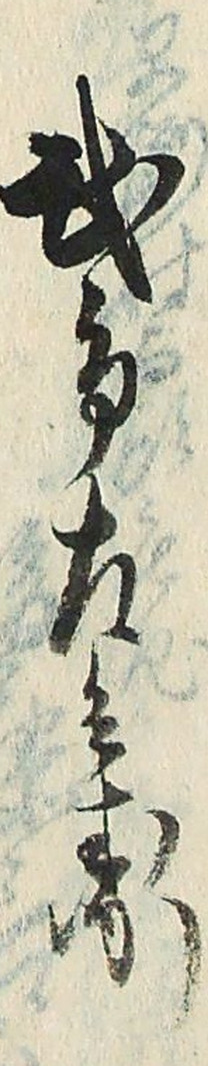武島佐兵衛
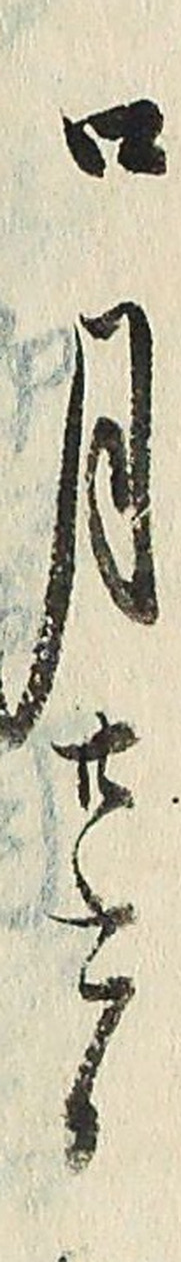四月廿六日
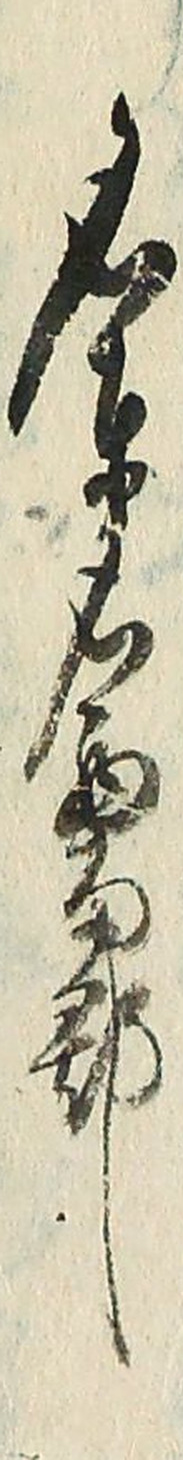名東名西郡
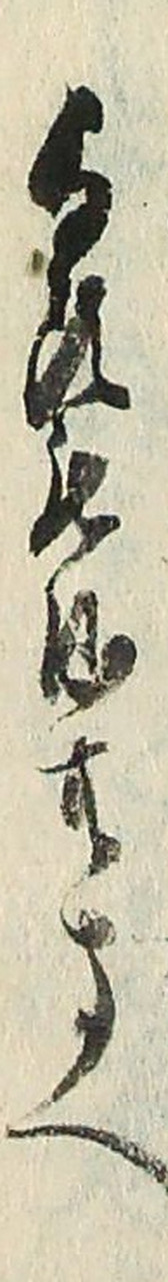与頭庄屋共方へ
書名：諸御用御□受書控
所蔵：鳴門教育大学 Naruto University of Education
